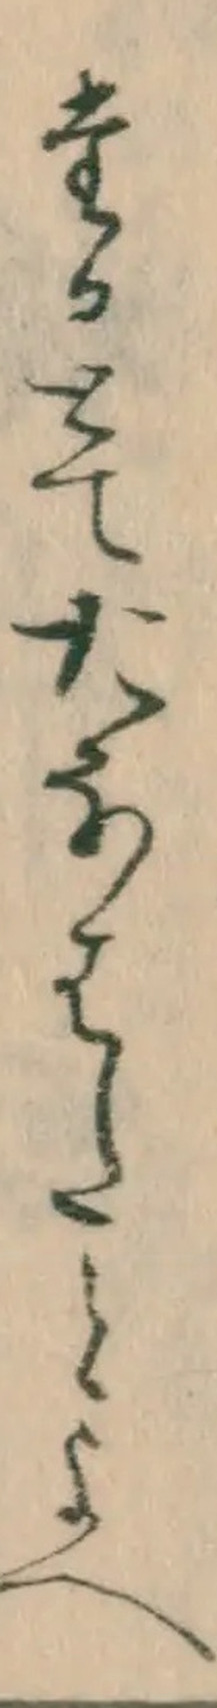たるとてたなはたとよへ
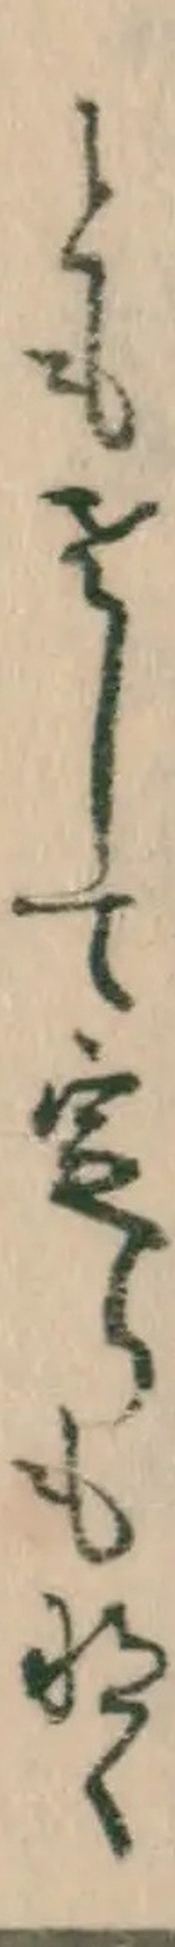どもさして定りもなく
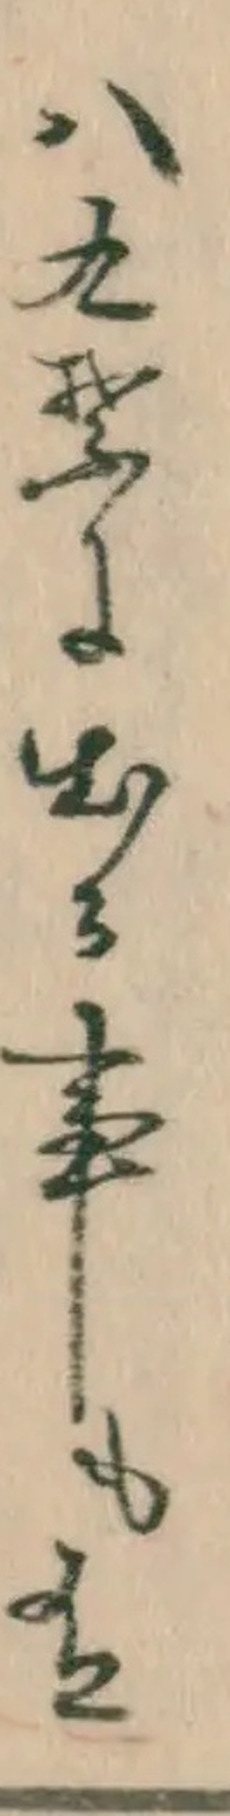八九葉に出る事も有
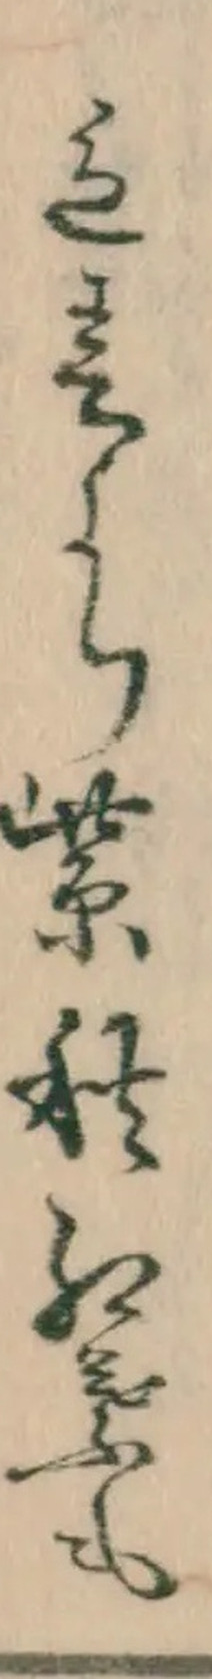色青より紫秋紅葉も
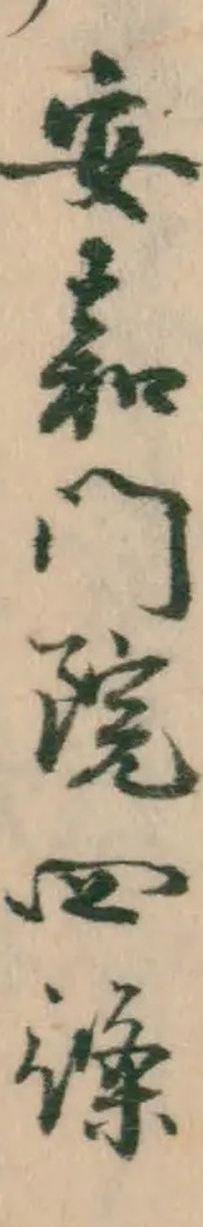安嘉門院四條
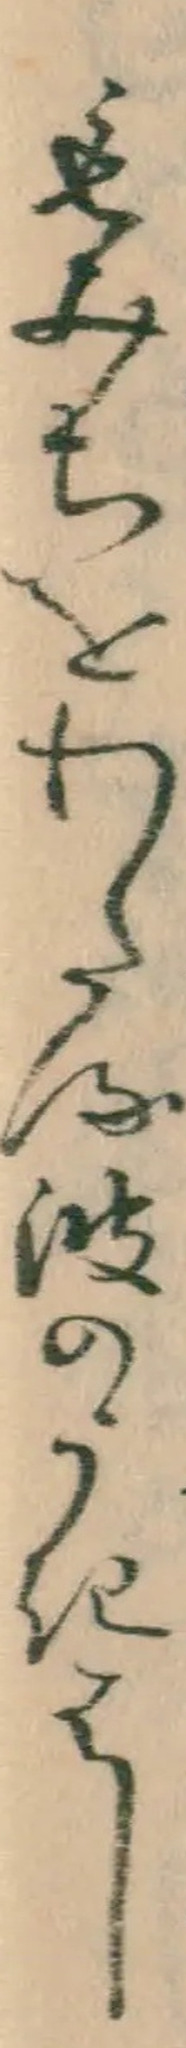もみちをわたる波のうきはし
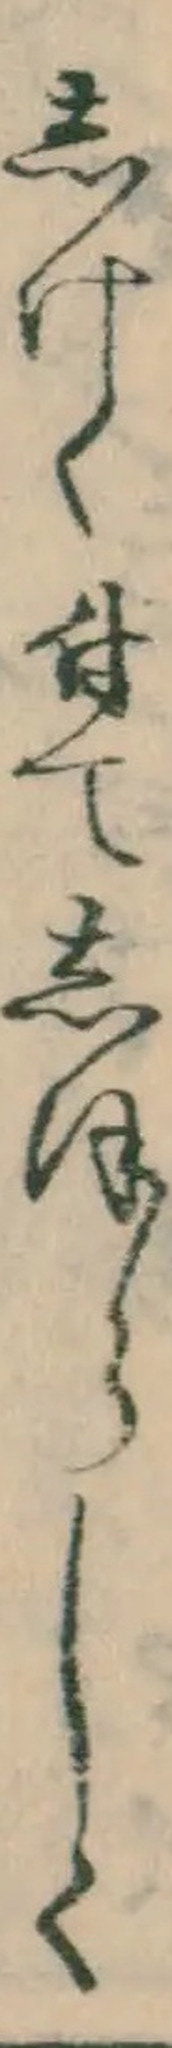しけく付てしほらしく
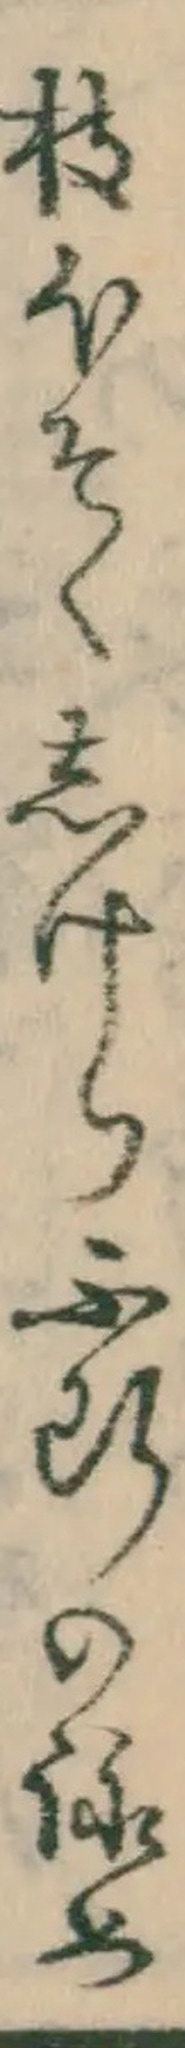枝ほそくしけり不断の詠め
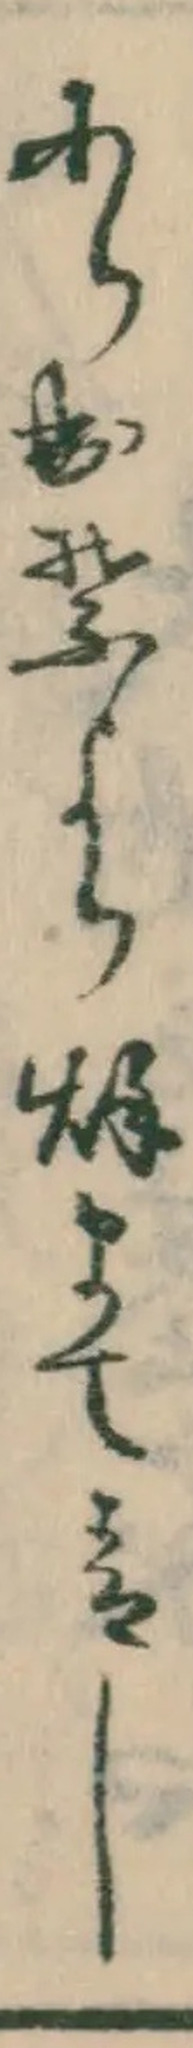あり出葉より秋まて青し
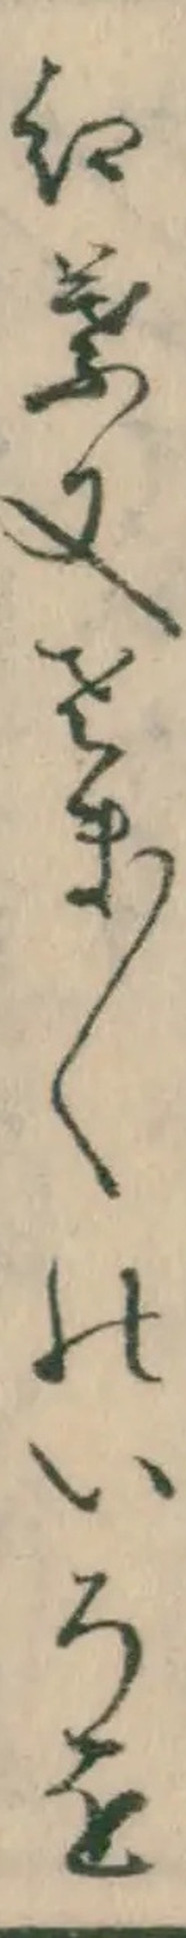紅葉又さま〳〵のいろを
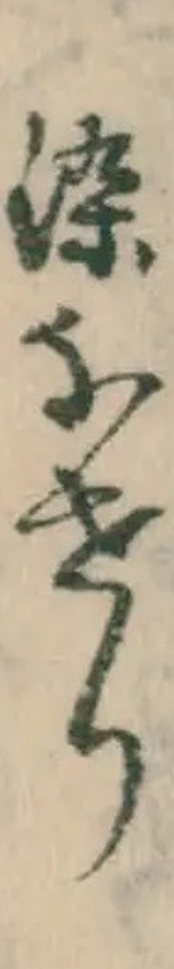染なせり
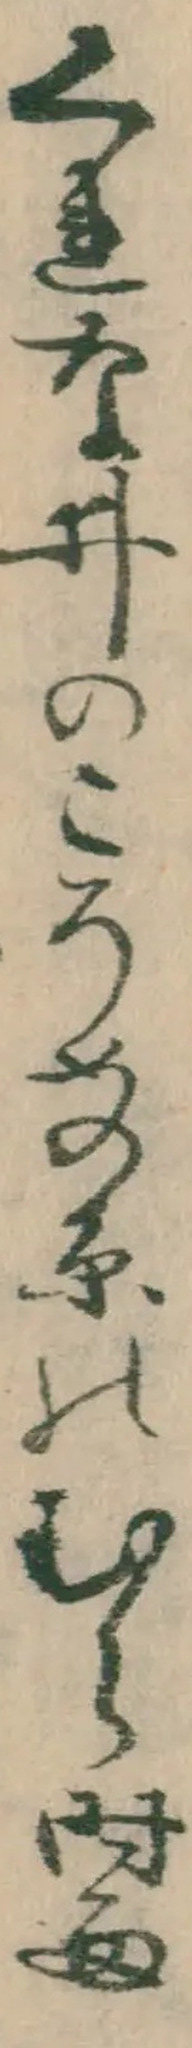くれなゐのこそめの糸のむら時雨
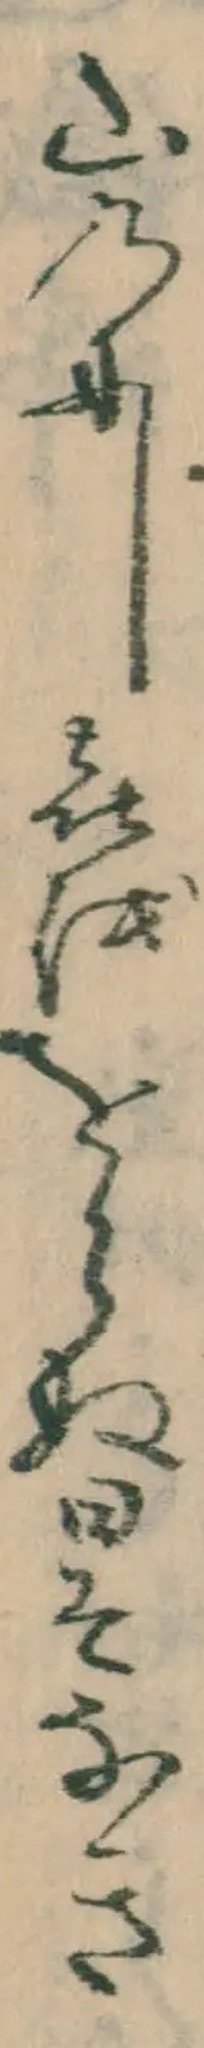山のにしきををらぬ日そなき

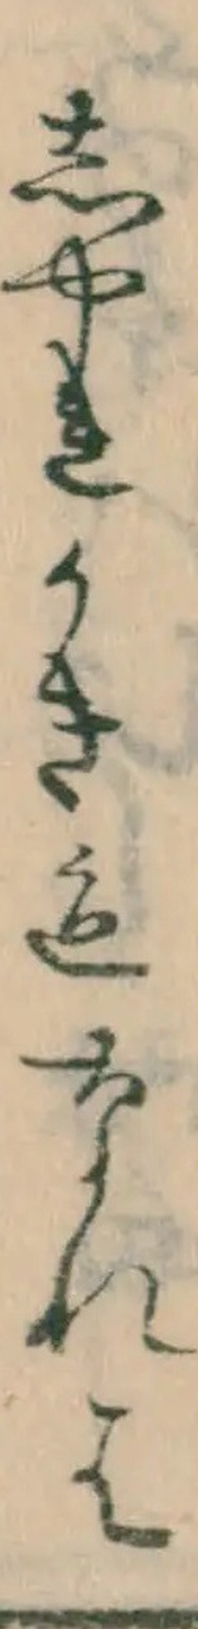しやれかき色なれは
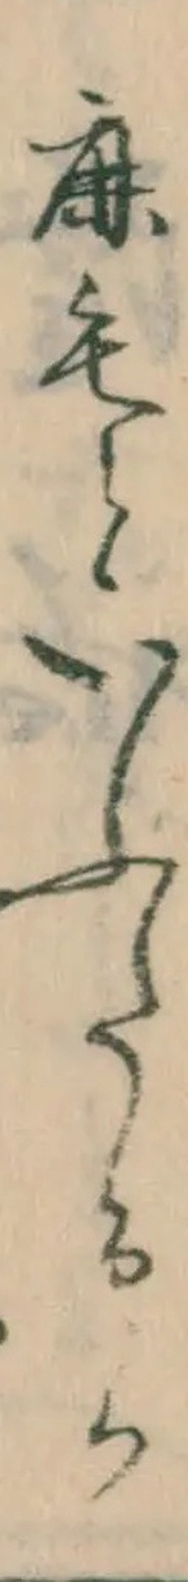鹿毛といふたるか
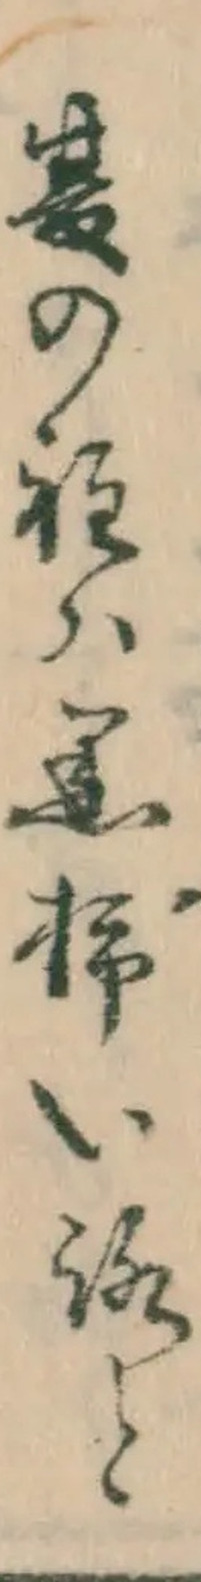夏の程は黒柿いろと
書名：紅葉集
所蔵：国立国会図書館 National Diet Library, JAPAN
